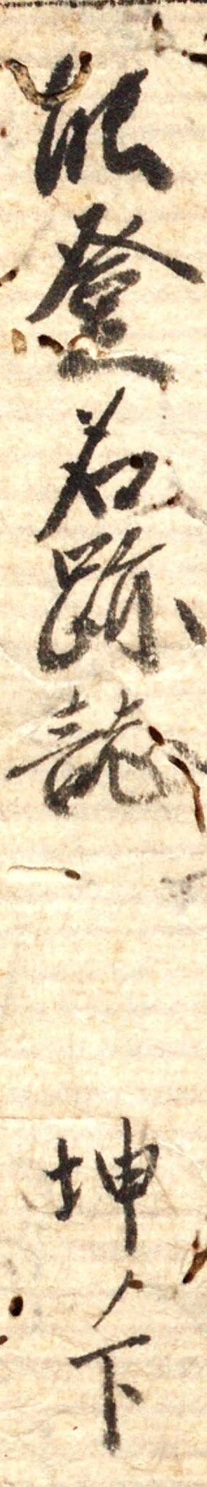能登名跡誌坤ノ下
